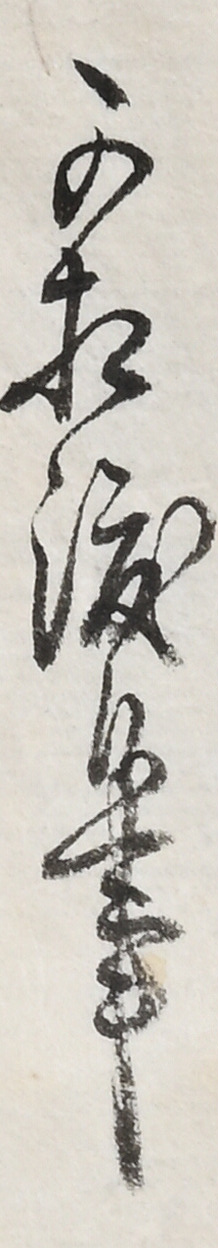可相渡候事
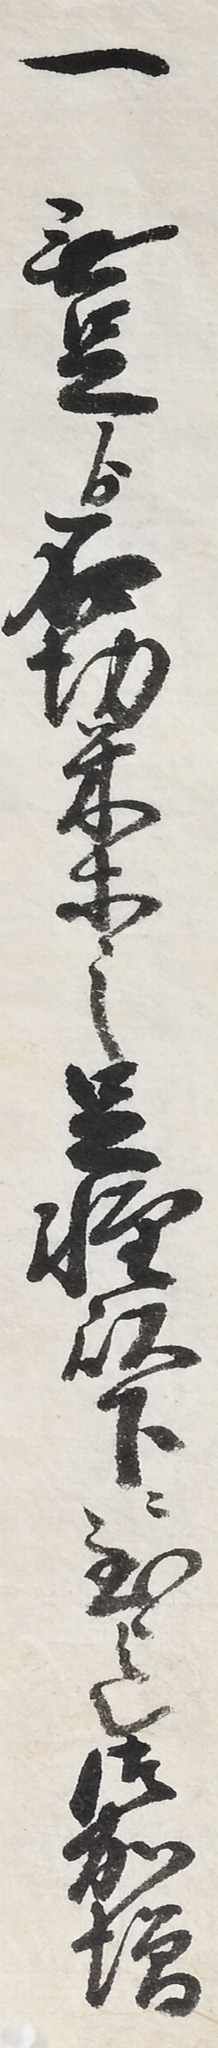一無足ゟ石切米等之足軽以下ニ至迄御加増
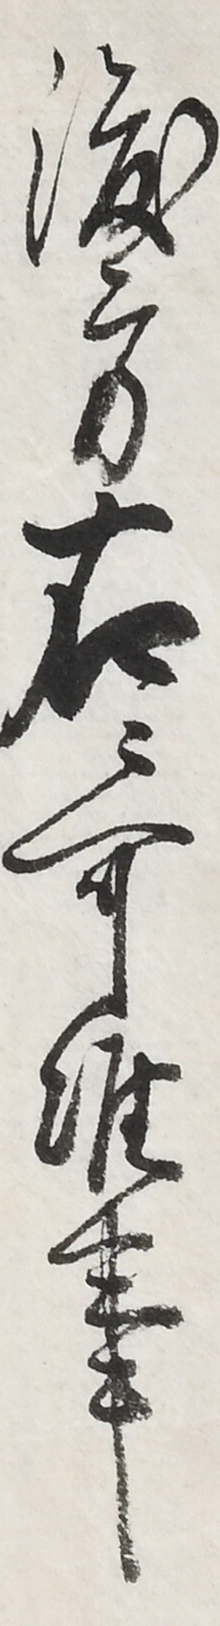渡方右ニ可准事
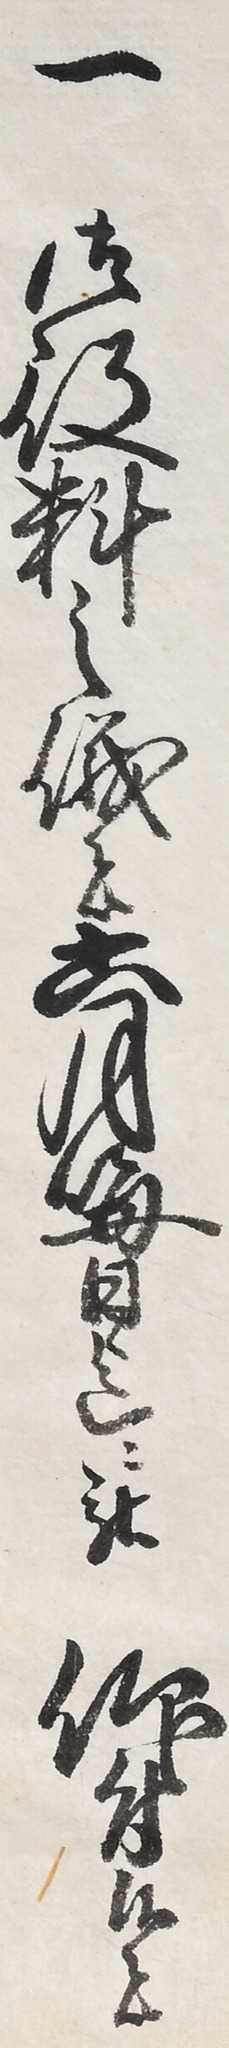一御役料之儀は六月晦日迄ニ被仰付候は
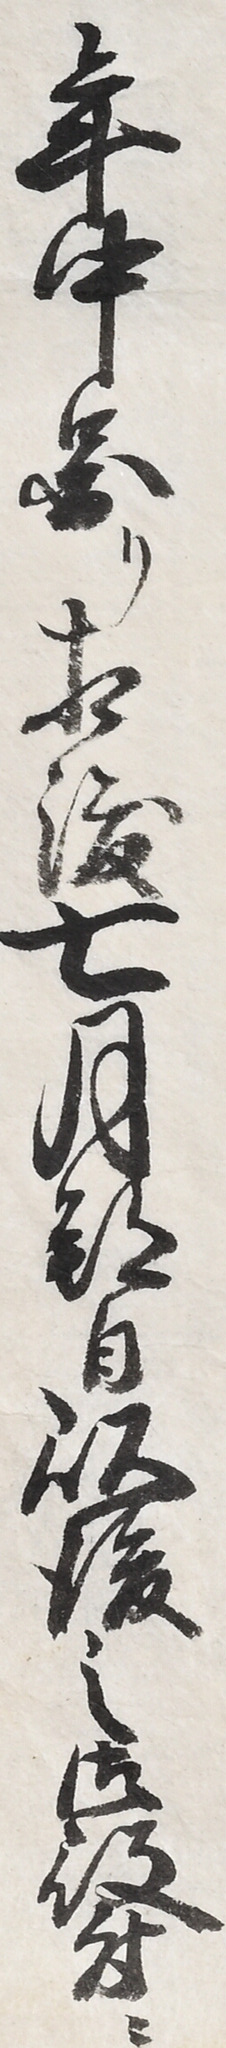年中図り相渡七月朔日以後之御役付ニ
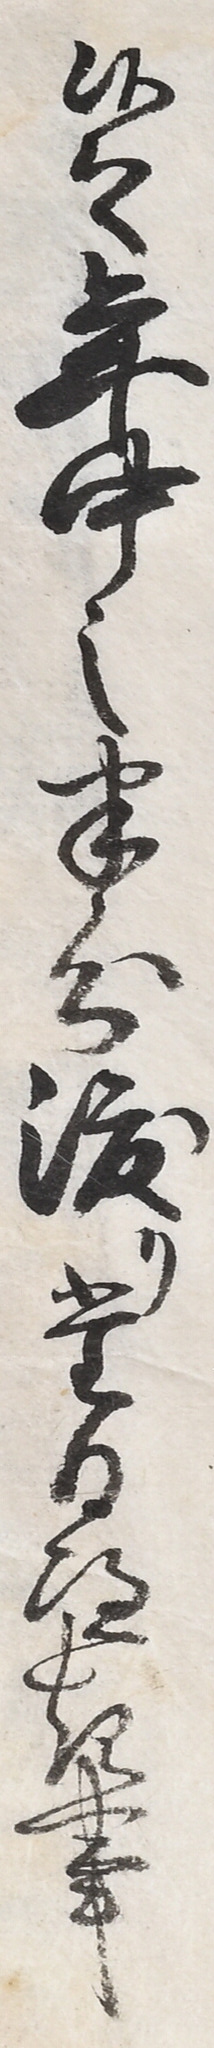候ハヽ年中之半分渡りたるへき事
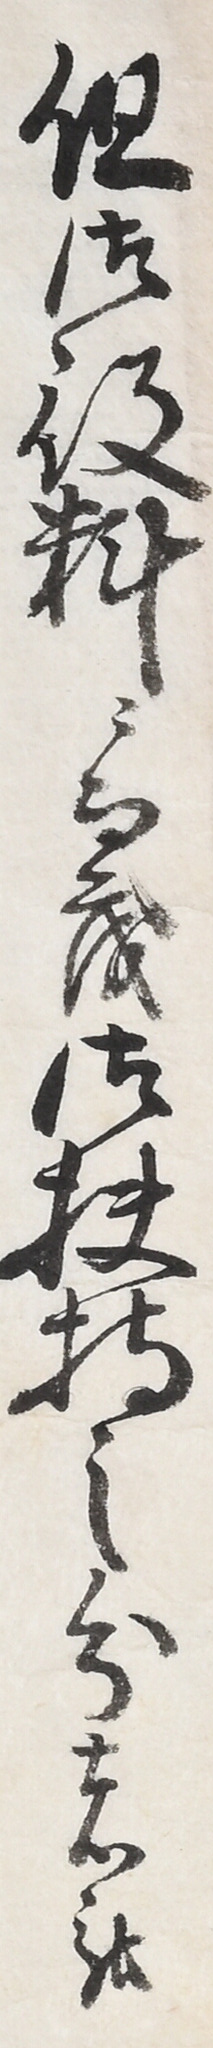但御役料ニ而も御扶持之分は被
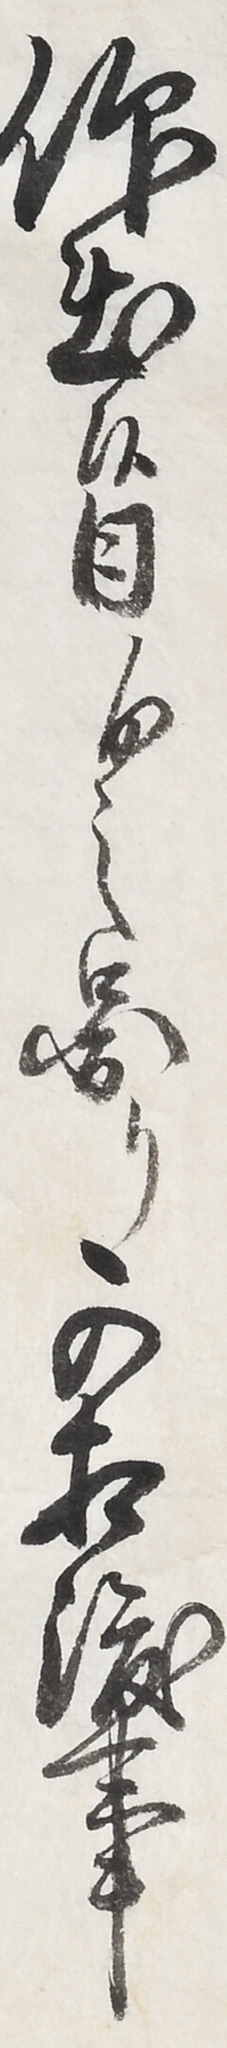仰出候月ゟ之図り可相渡事
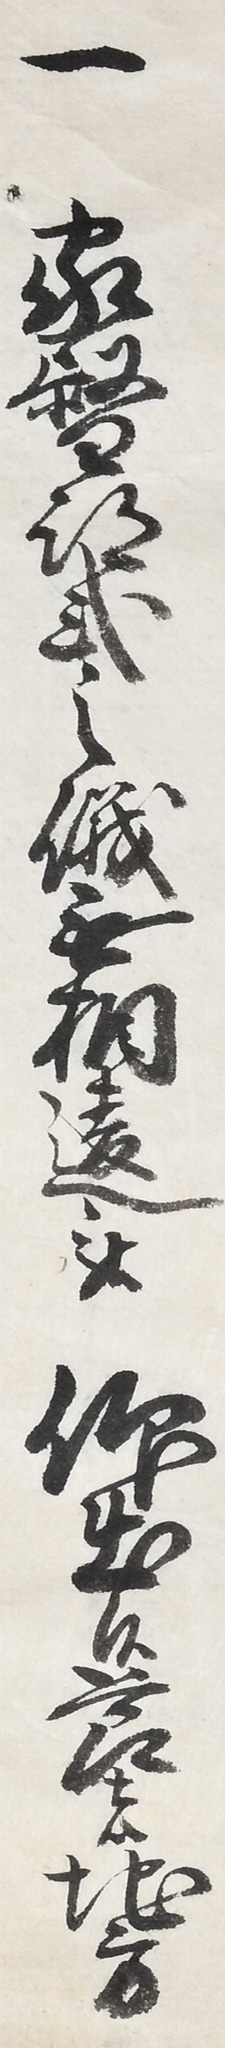一家督跡式之儀無相違被仰出候節は地方
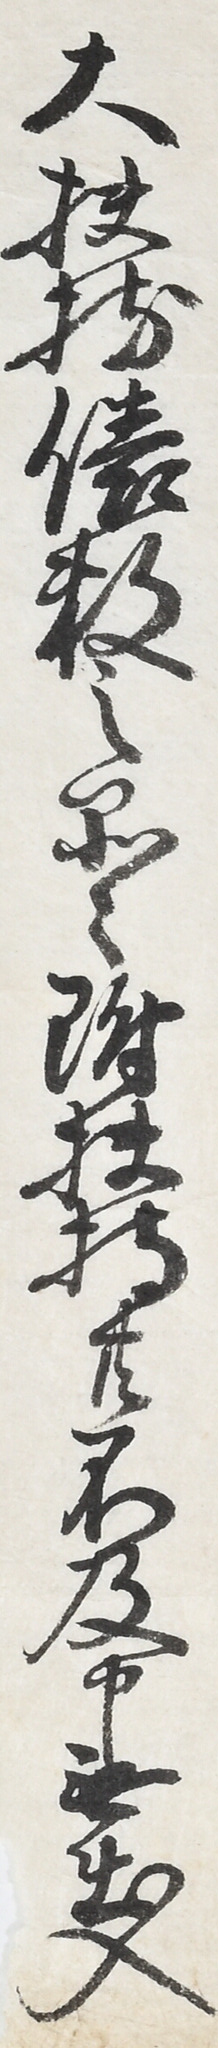大扶持俵数之品々附扶持共不及申無出入
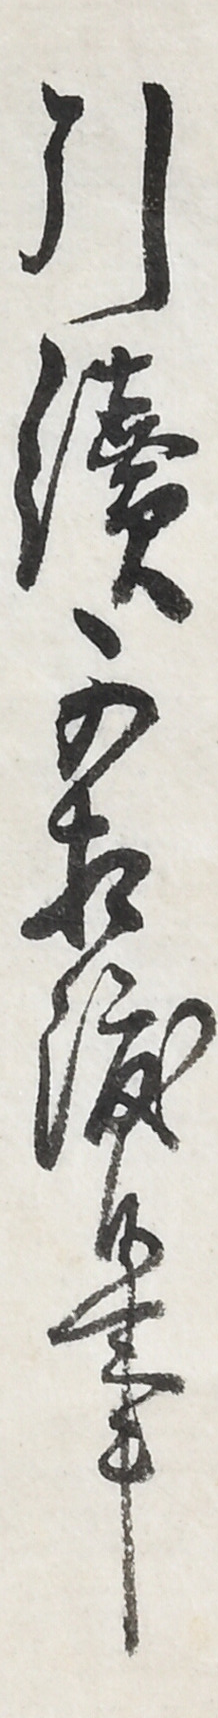引続可相渡候事
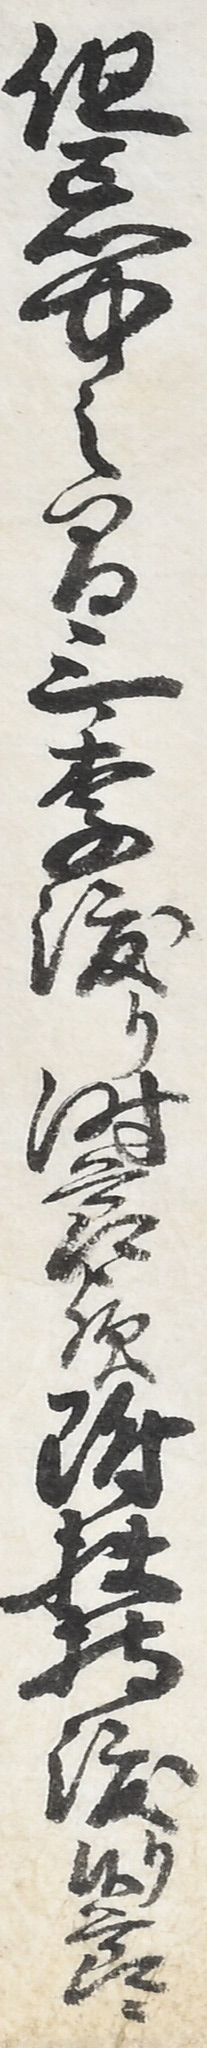但忌中之間三季渡り時節欤附扶持渡り候節ニ
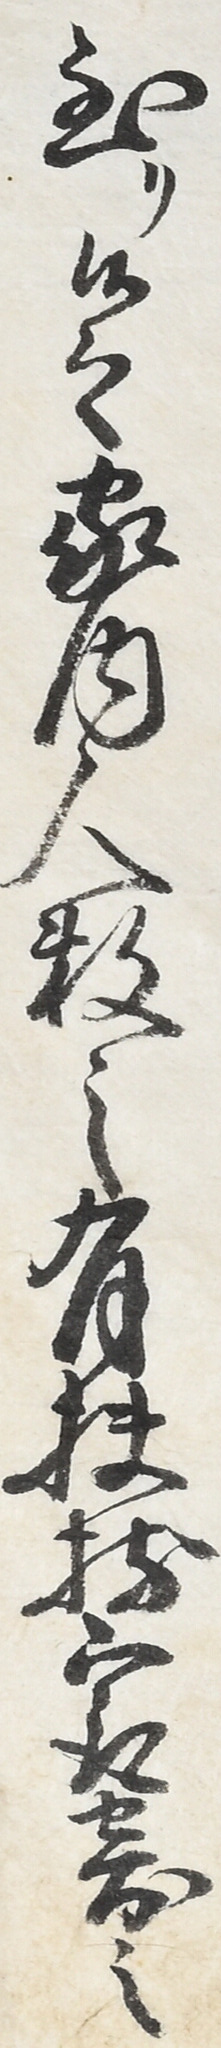至り候ハヽ家内人数之有扶持最寄之
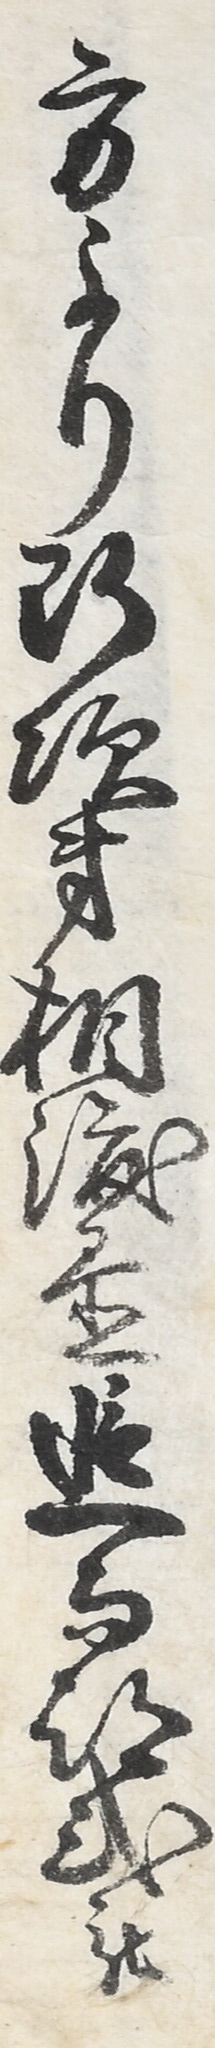方より断次第相渡置追而跡式被

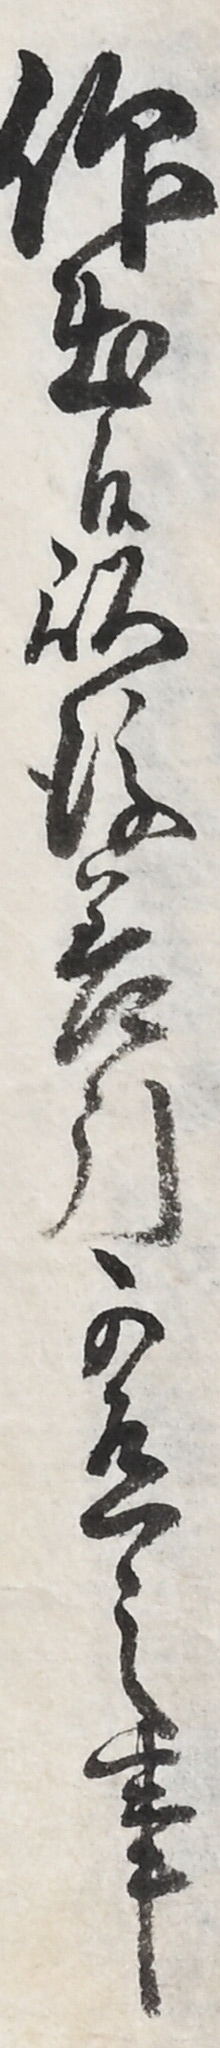仰出候以後差引可有之事
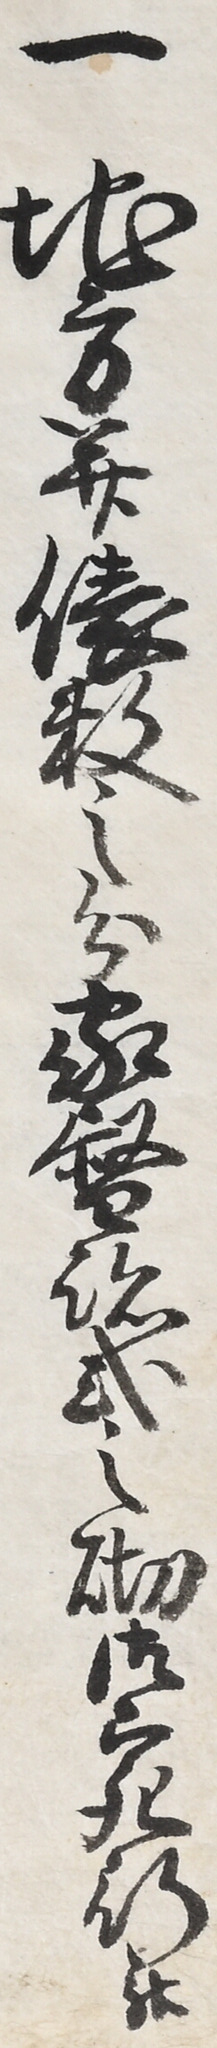一地方并俵数之分家督跡式之砌御宛行被
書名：御給分渡方之定
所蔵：伊那市立高遠町図書館・合同会社AMANE
